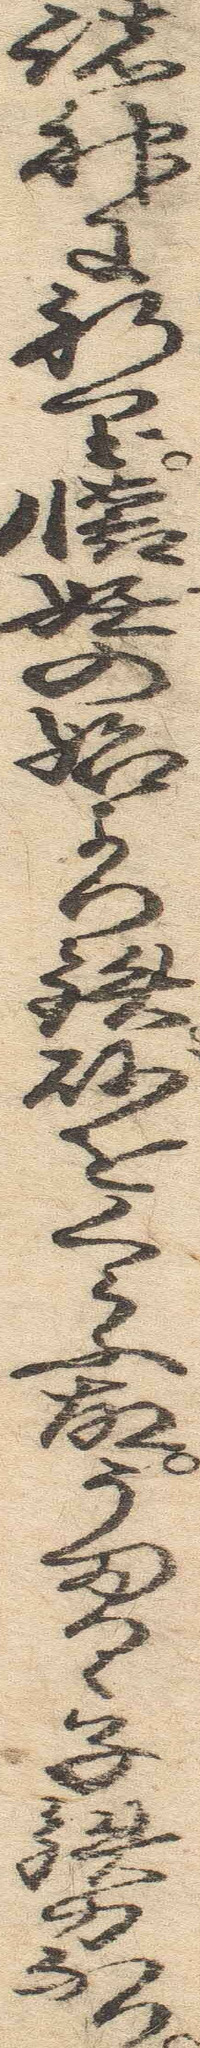諸神に祈り懐妊の始より鉄砂をくらふ故。うまるゝ子強力なり。
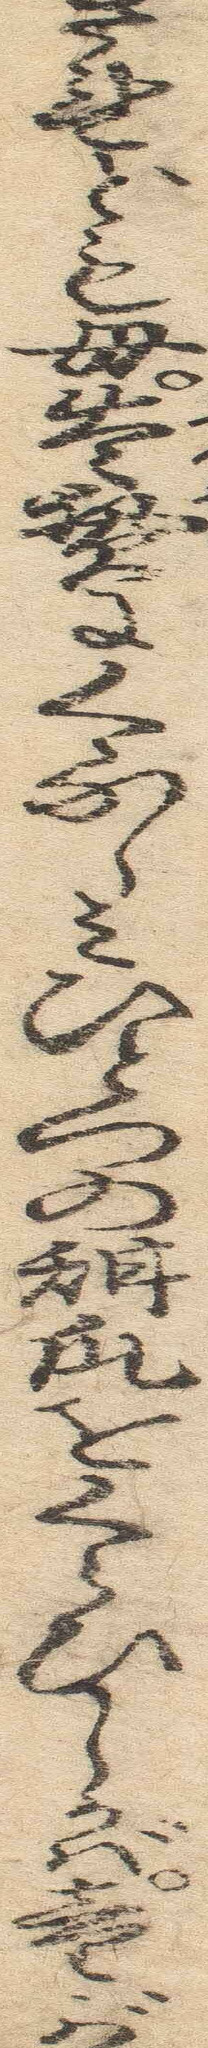されども母。炎熱にくるしみひとつの甜瓜をくらいしかば。童が
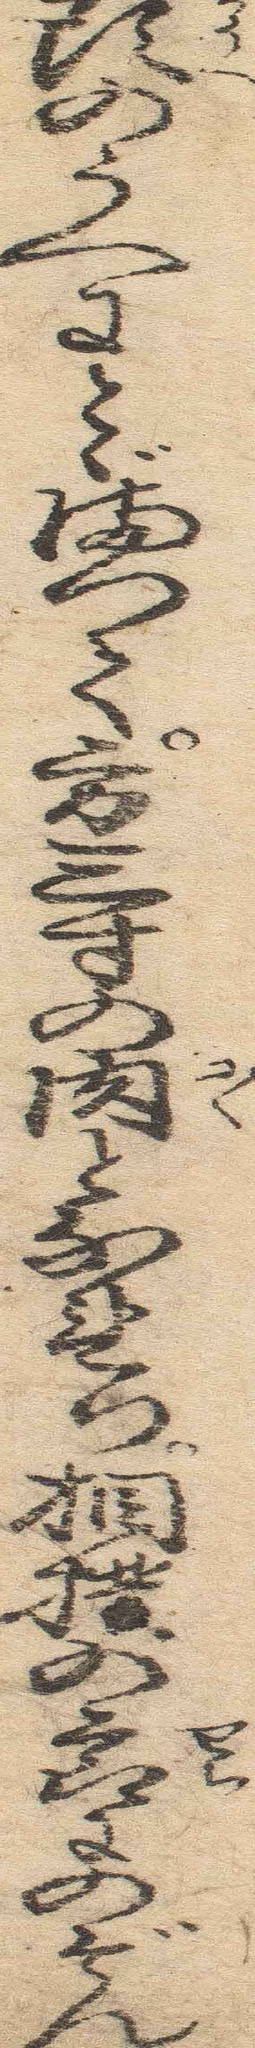頭のうへにとゞまつて。方三寸の肉となれり。相撲の節にのぞん
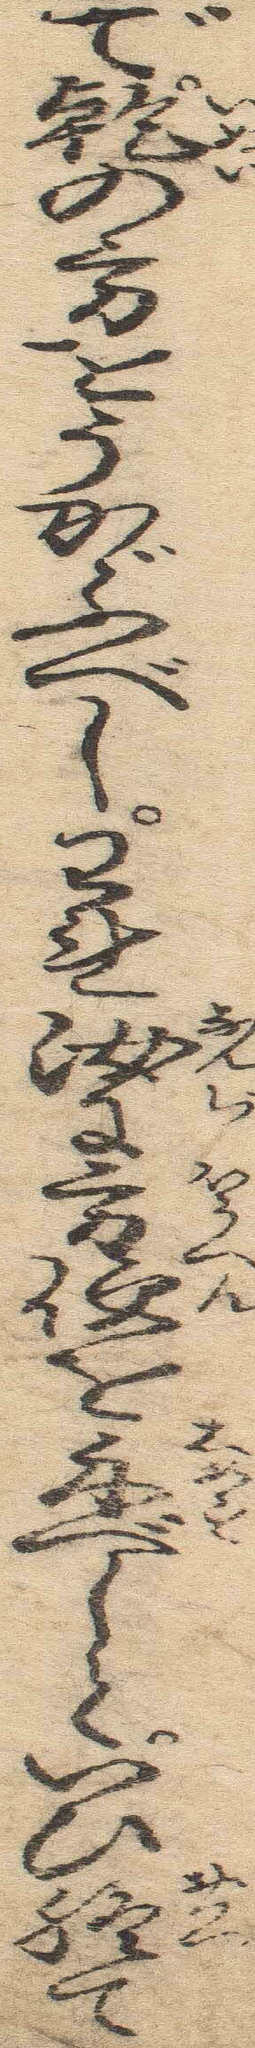で乾の方をうかゞうべし。われ汝に方便を示べしと。いひ終て
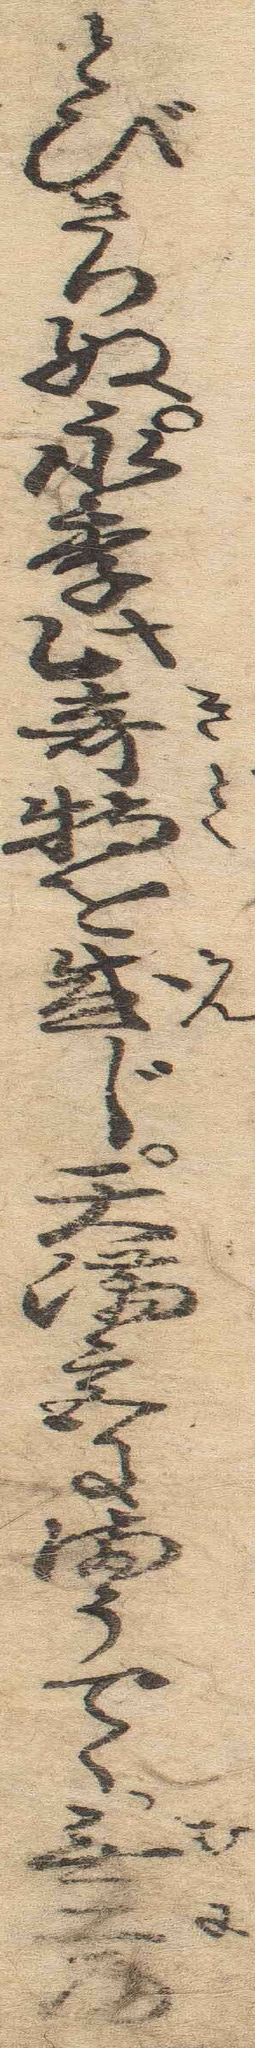とびさりぬ。永季此奇特を感じ。天満宮にまうでて無二の
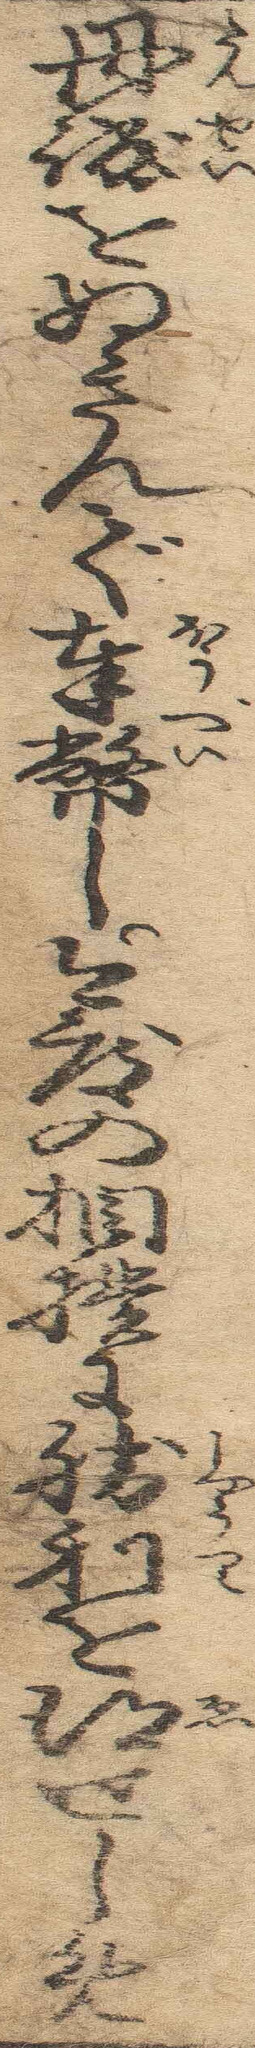丹誠をぬきんで奉幣し。今度の相撲に勝利を得せしめ

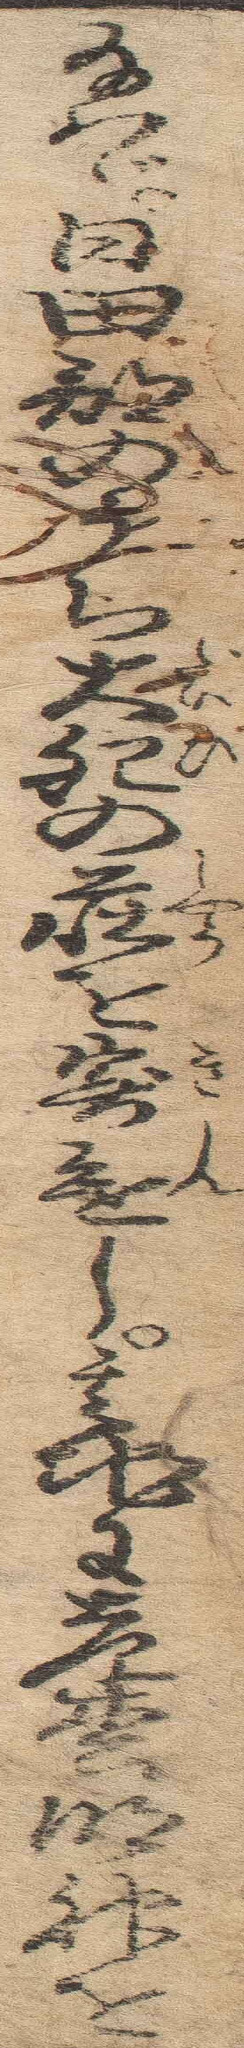給はゞ。日田郡のうち大肥の壮を寄進し。其地に老松明神を
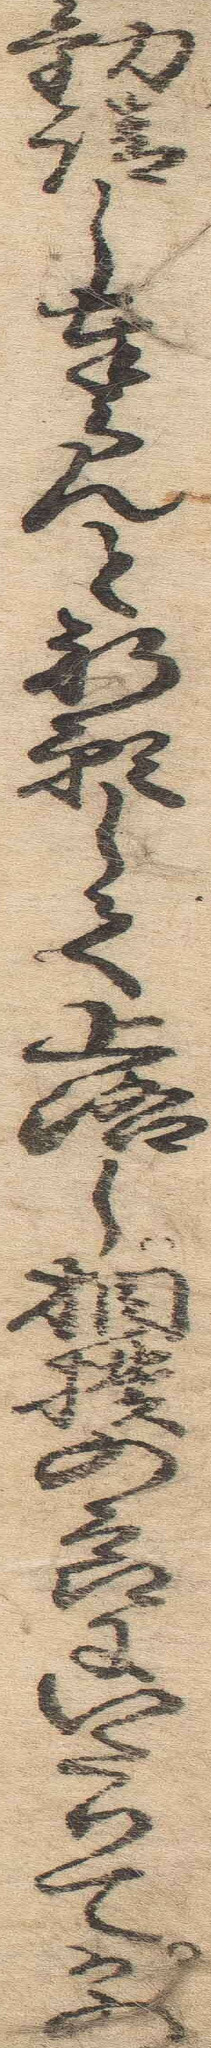勧請し奉らんと祈願して上洛し相撲の節にいたりて。かの
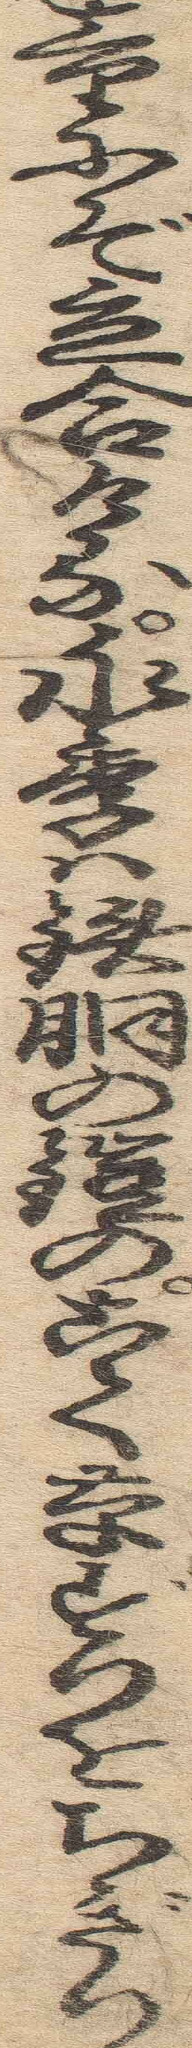童にぞ立合ける。永季は鉄胴の鎧の。こて草ずりをちぎり
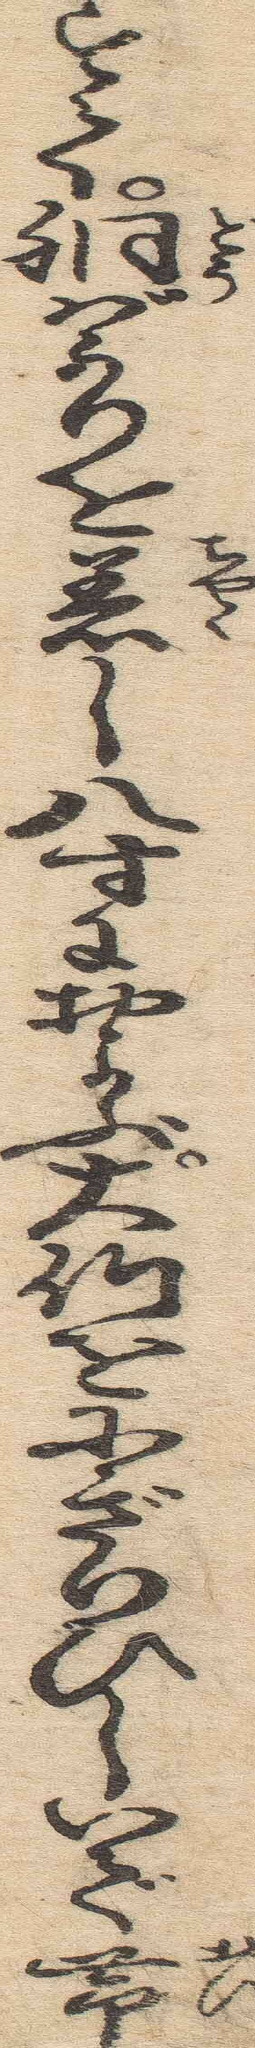すて。胴ばかりを着し八寸におよぶ大竹をにぎりひしいで帯
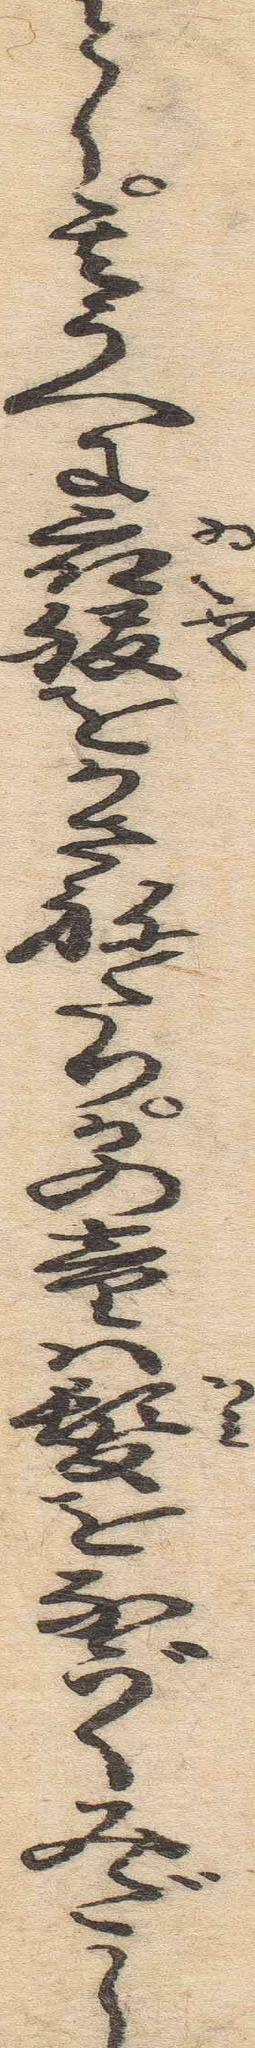とし。其うへに衣服をかさねたり。かの童は髪をながしみだし
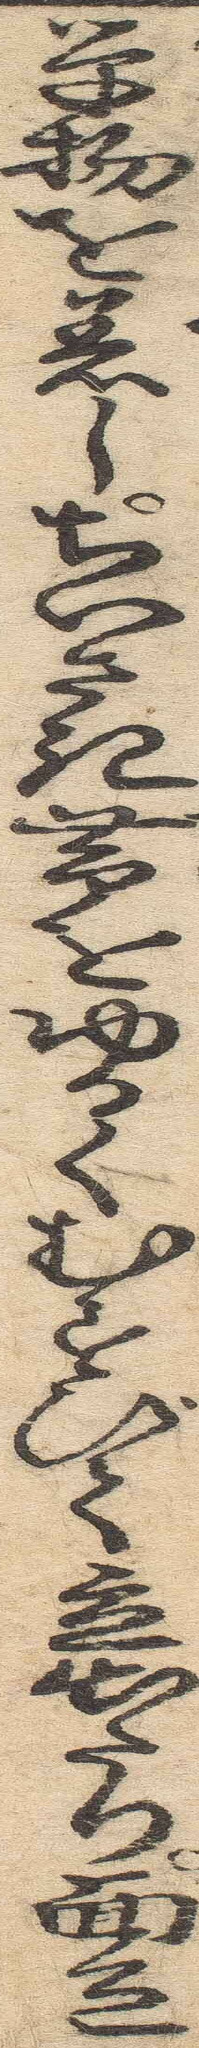単物を着し。ちいさき帯をゆるくむすびて立出たり。面色
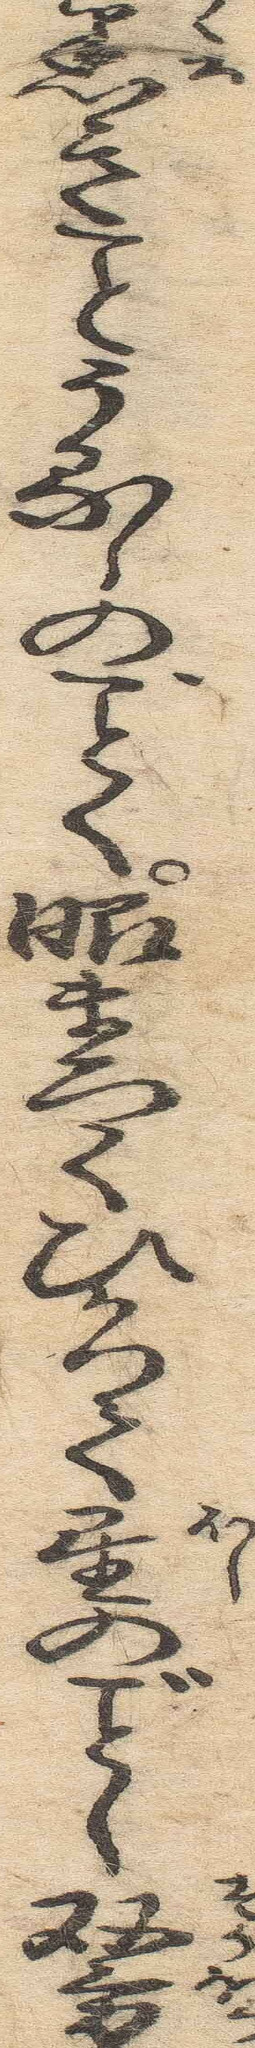黒きことうるしのごとく。眼まろくひかりて星のごとく双方
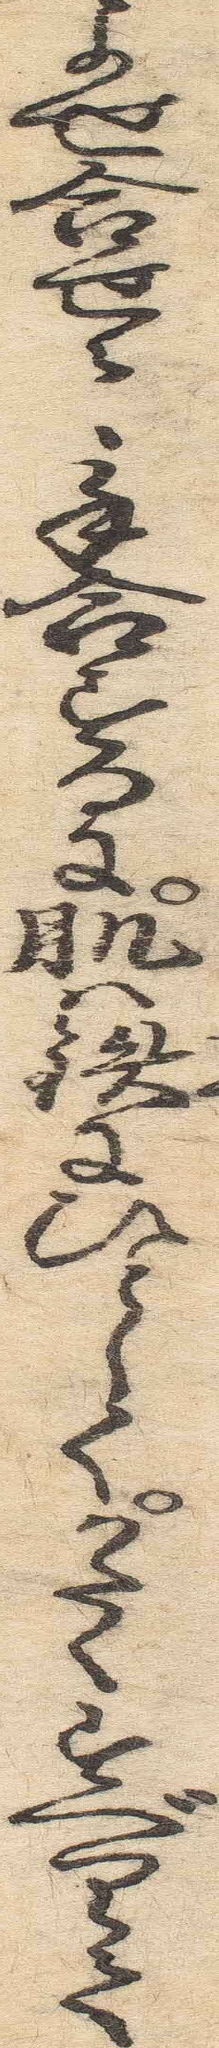よせ合せつゝ手合するに。肌は鉄にひとしく。かたくすべりて
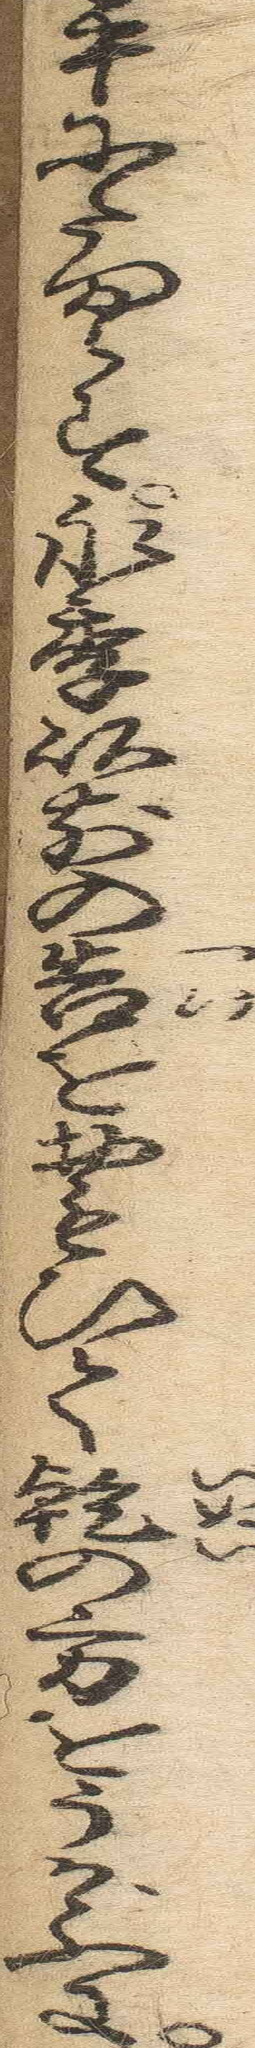手にたまらず。永季以前の告をおもひて乾の方をうかがふに
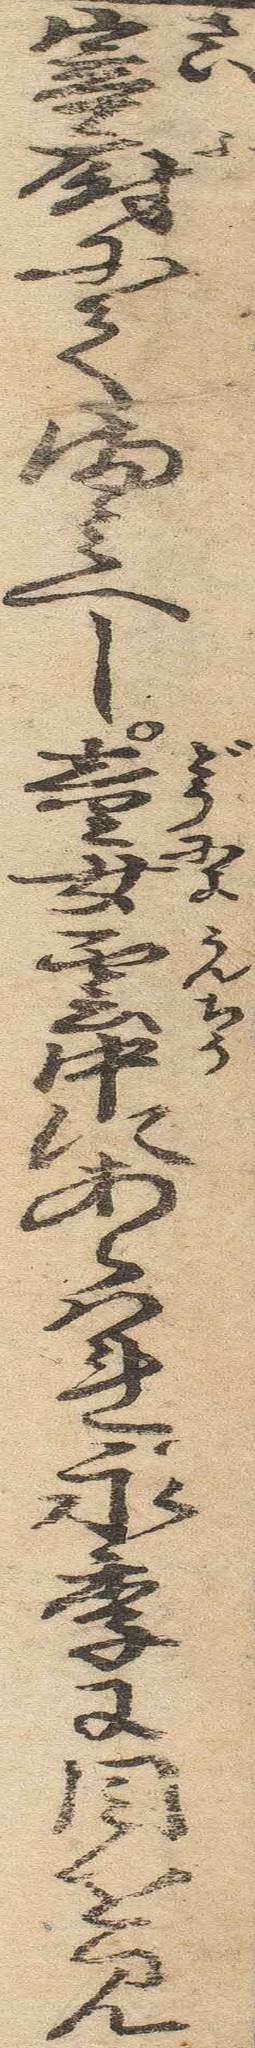宰府にてまみへし。童女雲中にあらはれ。永季に目を見
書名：古今相撲大全
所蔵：東京学芸大学附属図書館 国文学研究資料館
